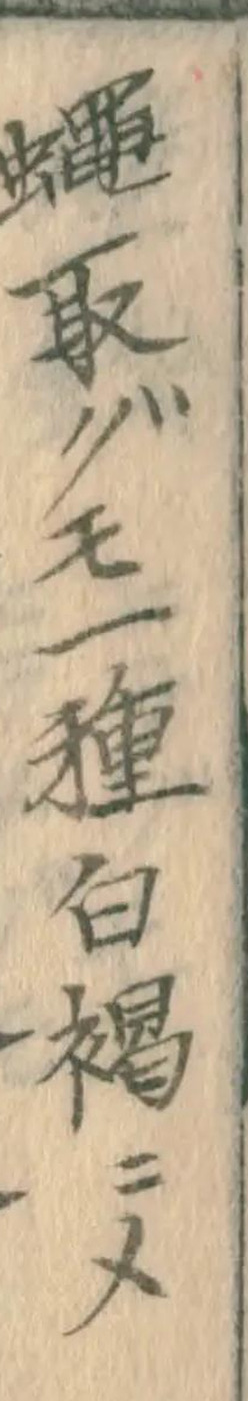蠅取グモ一種白褐ニシテ
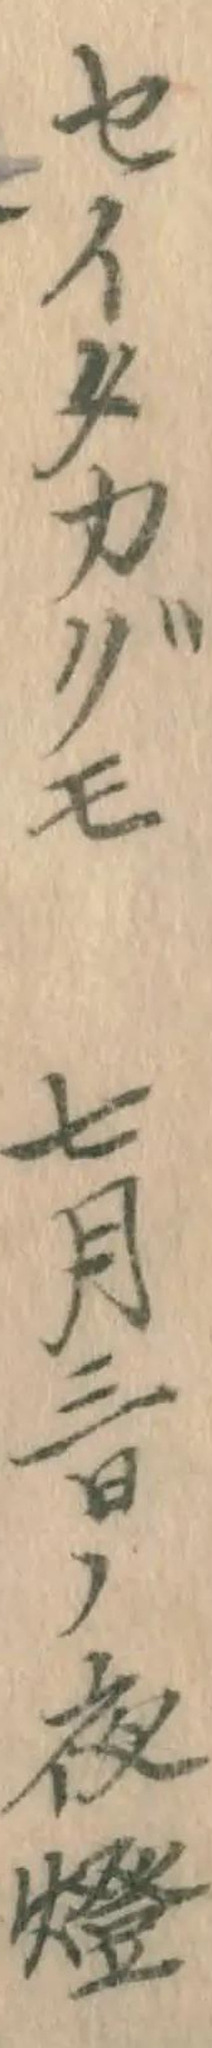セイタカグモ七月三日ノ夜燈
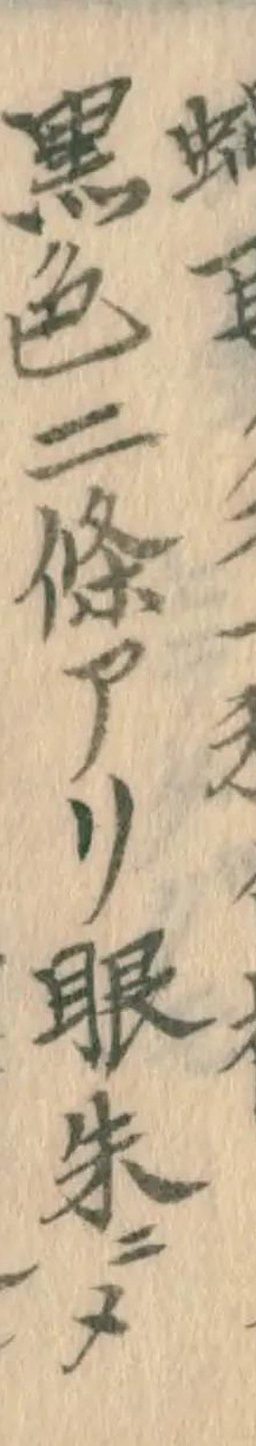黒色二條アリ眼朱ニシテ
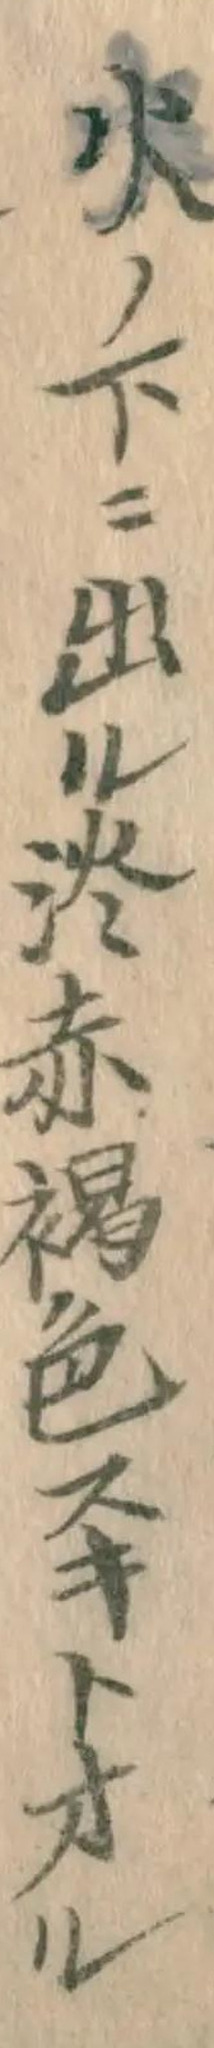火ノ下ニ出ル淡赤褐色スキトオル
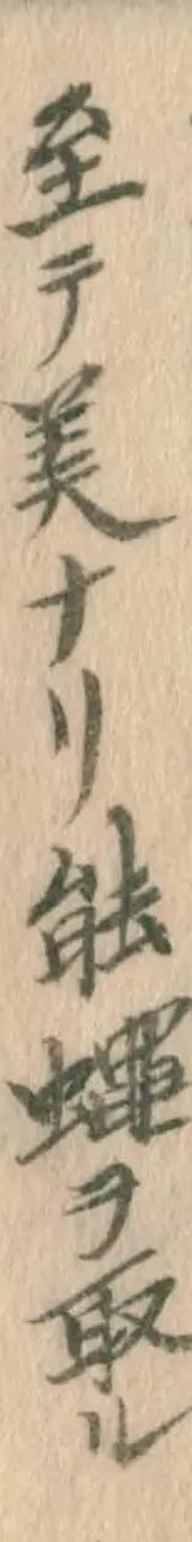至テ美ナリ能蠅ヲ取ル
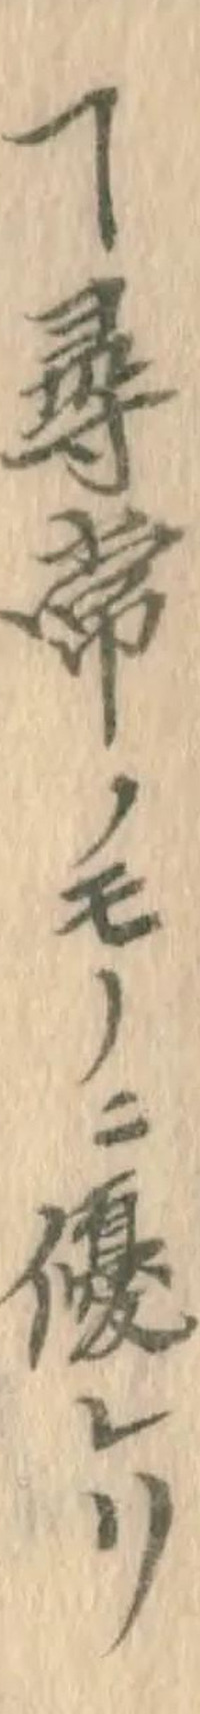コト尋常ノモノニ優レリ
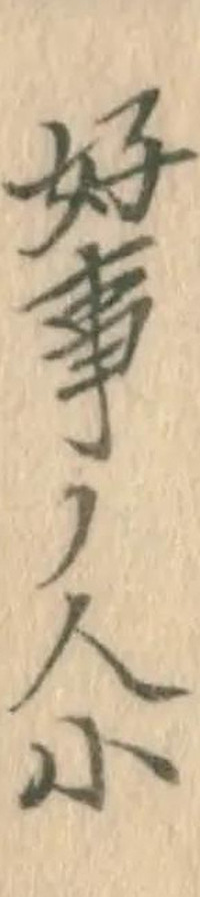好事ノ人小
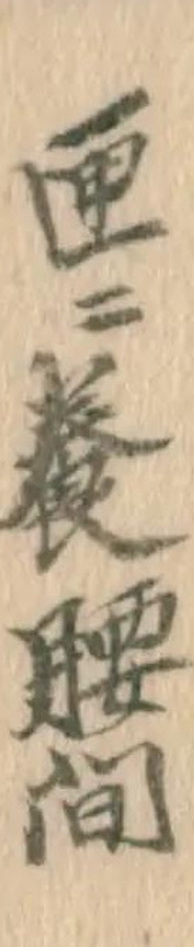匣ニ養腰間
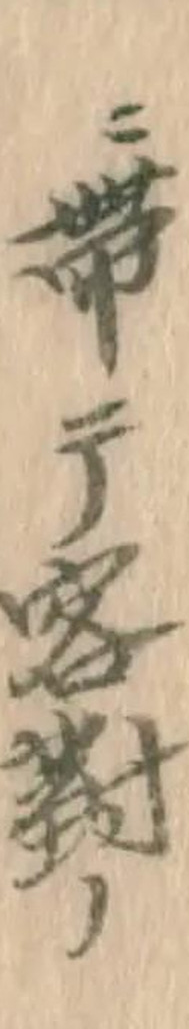ニ帯テ客對ノ
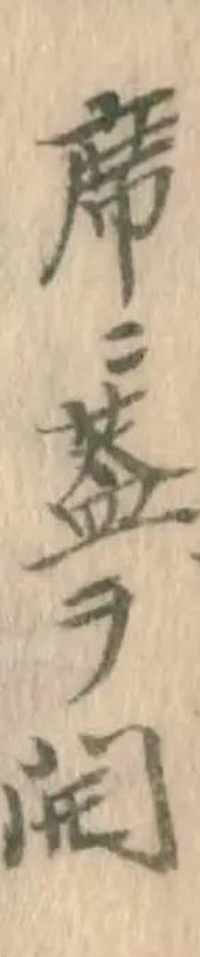席ニ蓋ヲ開
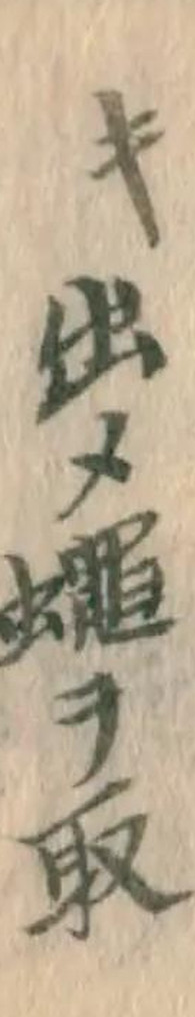キ出シテ蠅ヲ取
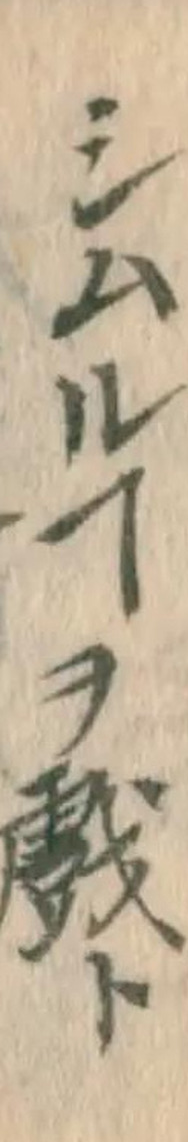シムルコトヲ戯ト
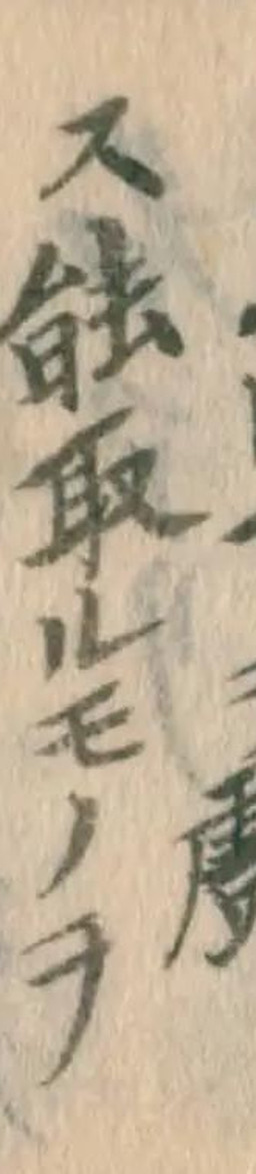ス能取ルモノヲ
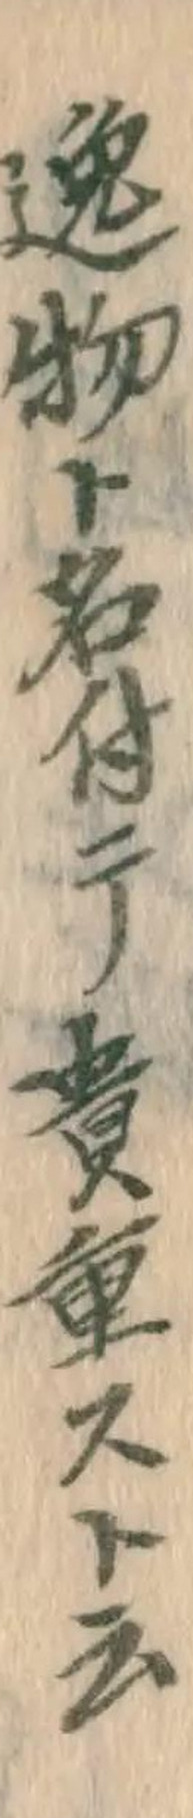逸物ト名付テ貴重スト云
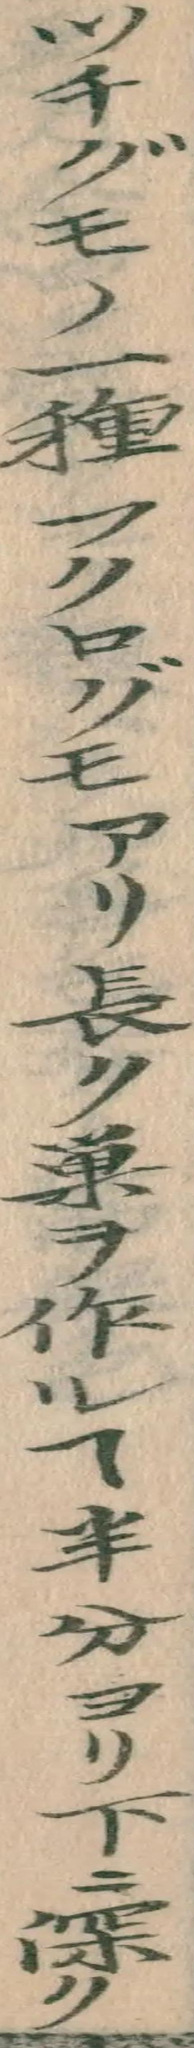ツチグモノ一種フクログモアリ長ク巣ヲ作ルコト半分ヨリ下ニ深ク
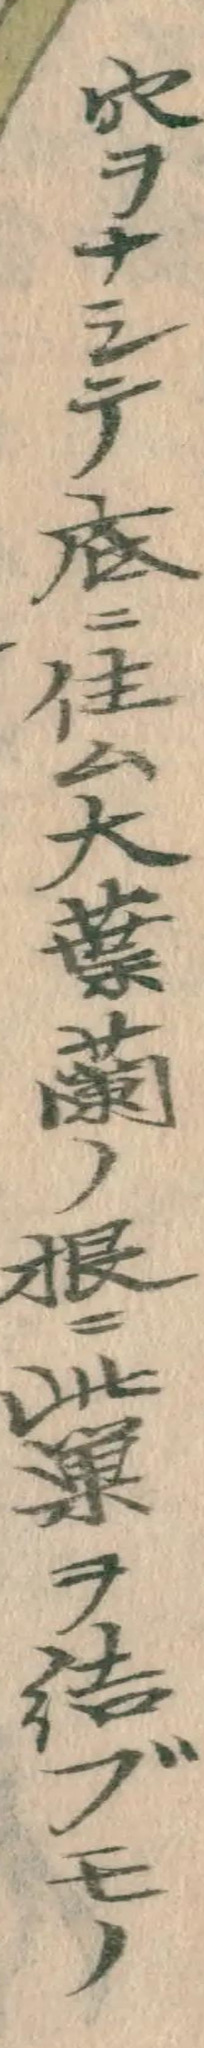穴ヲナシテ底ニ住ム大葉蘭ノ根ニ此巣ヲ結ブモノ
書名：千蟲譜 3巻. [2]
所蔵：国立国会図書館 National Diet Library, JAPAN
